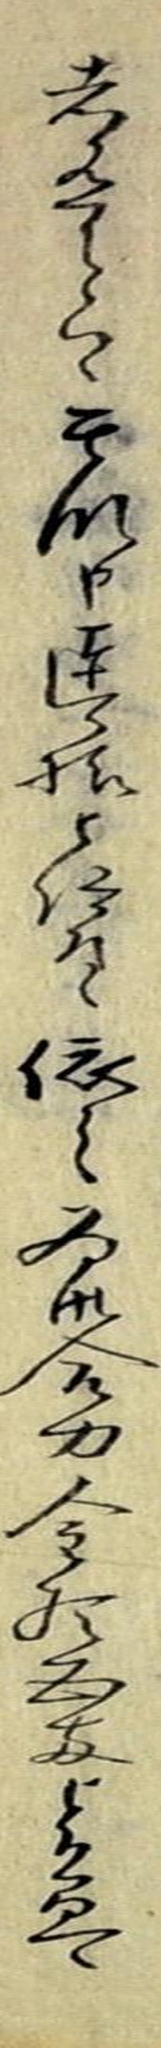者有之候はヽ其段達候様被仰付候依之為御合力金拾五両被下置候
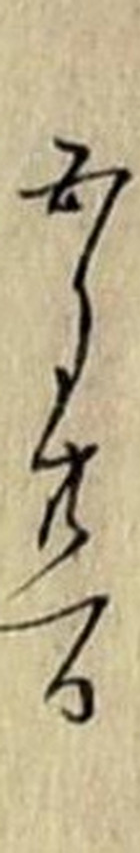五月廿一日
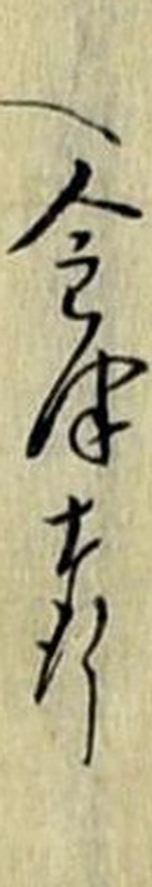金津奉行
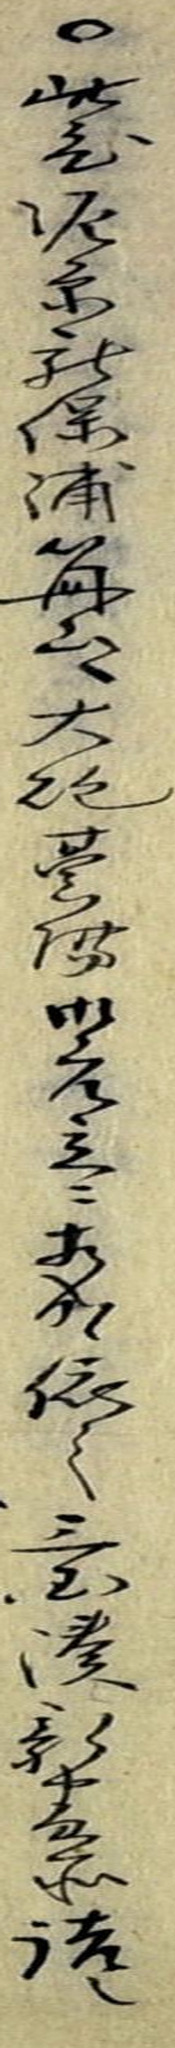○此度泥原新保浦篝山へ大炮台場御取立に相成候依之三国湊新番所詰之
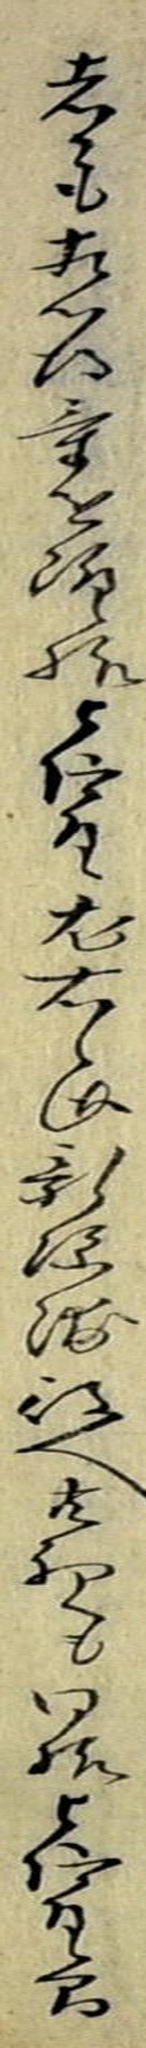者にも相心得気を附候様被仰付候尤右之趣新保浦役人共初へも同様被仰付候間
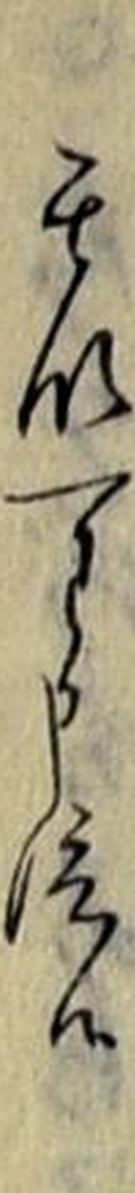其段可被申渡候
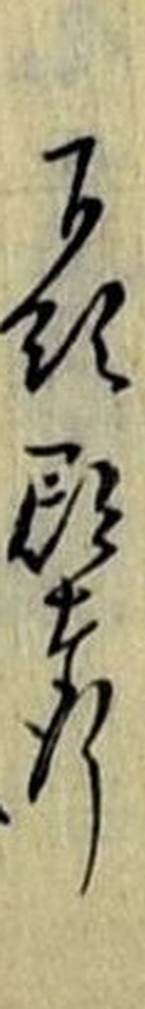下領郡奉行
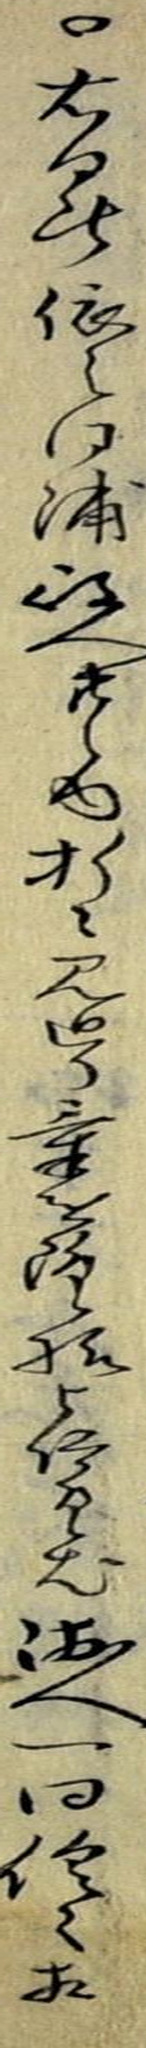○右同断依之同浦役人共之内折々見廻り気を附候様被仰付候尤浦人一同倶々相
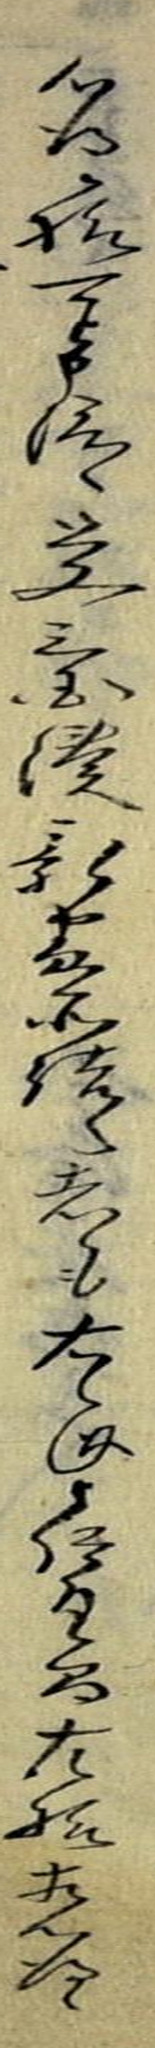心得候様可被申渡候且又三国湊新番所詰之者へも右之趣被仰付候間左様相心得候
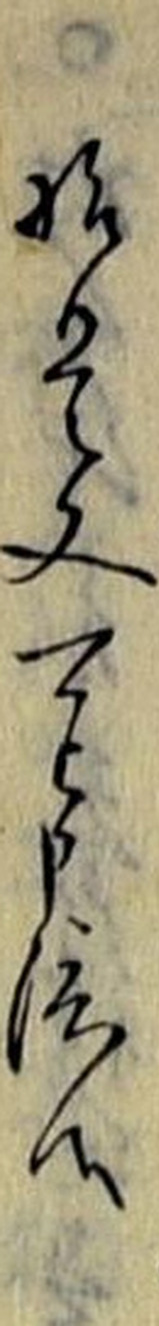様且又可被申渡候
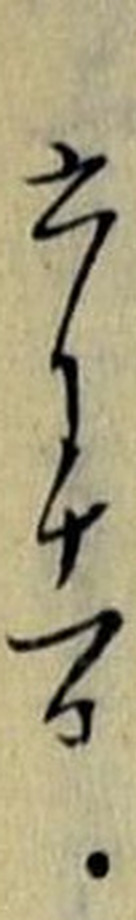六月十一日
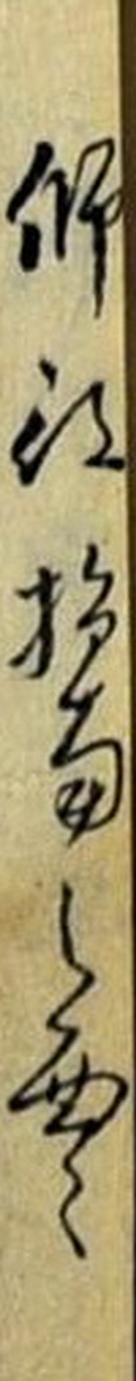師役指南之面々
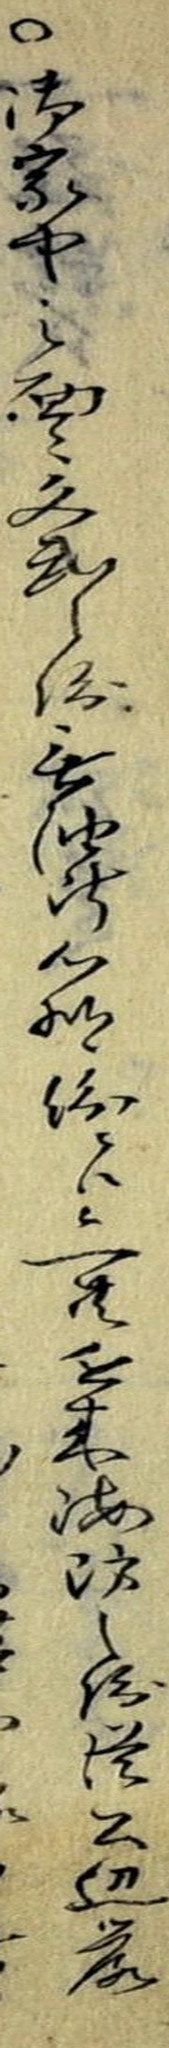○御家中之面々文武之儀無由断心掛候儀には候へ共近来海防之儀従公辺厳
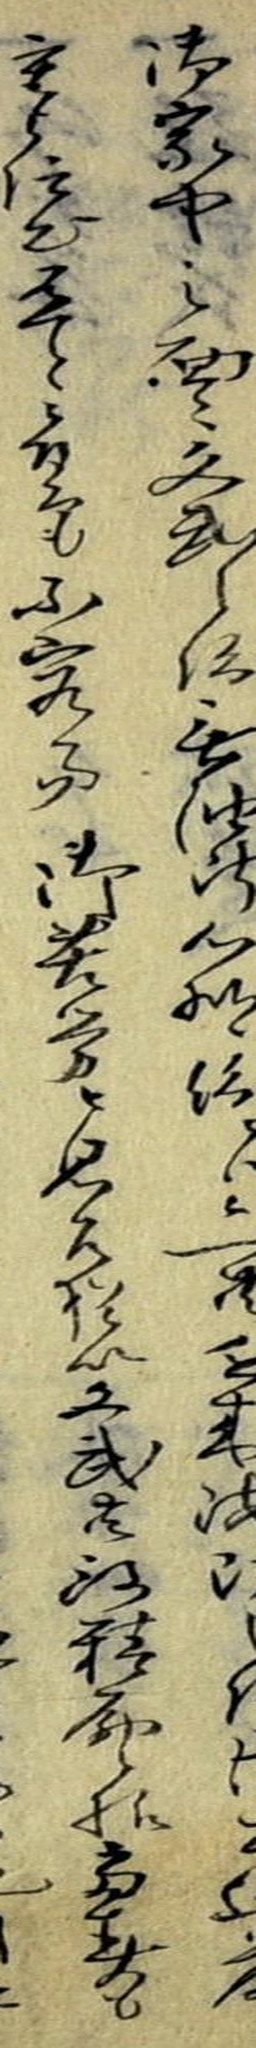重被仰出有之候に付而も不容易御苦労被思召猶以文武共致精励候様当春も
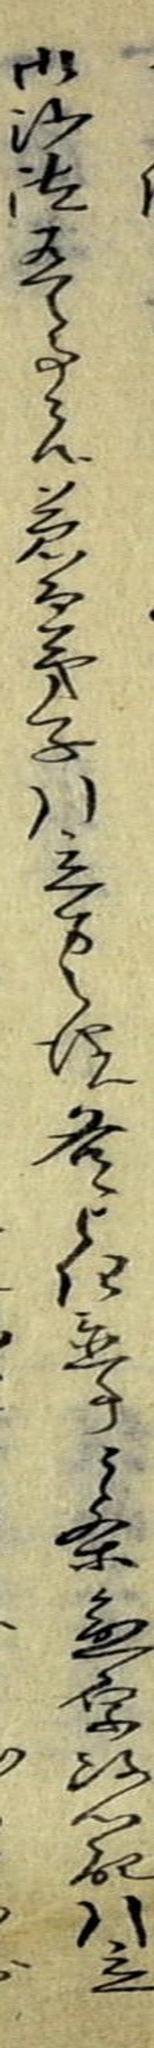御沙汰有之事に候兼而弟子引立方之儀は各へ被任置事に候条愈厚心配引立
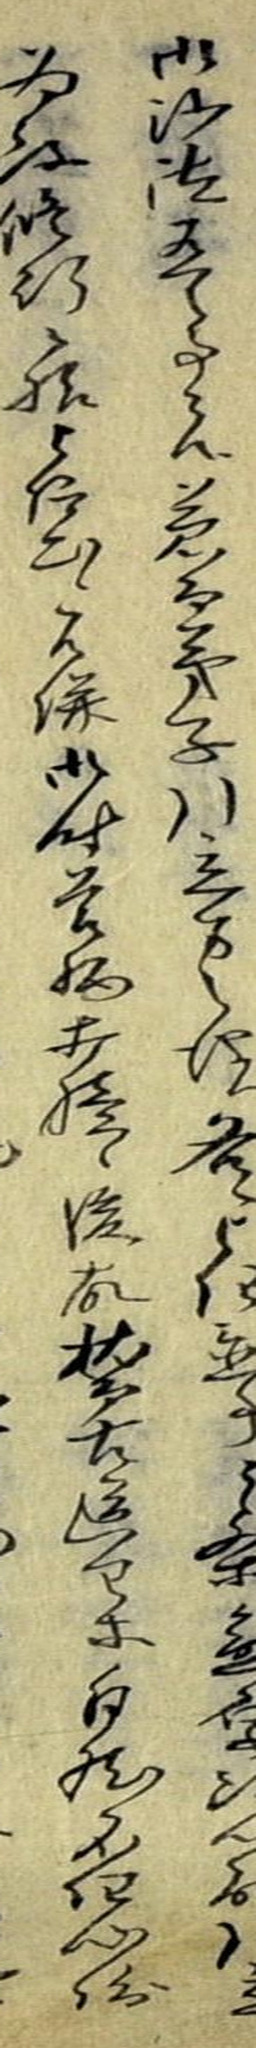為致修行候様被仰出候乍併御時節柄打続候後故稽古道具等自然不任心儀
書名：命令之部 六
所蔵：福井県文書館 Fukui Prefectural Archives
